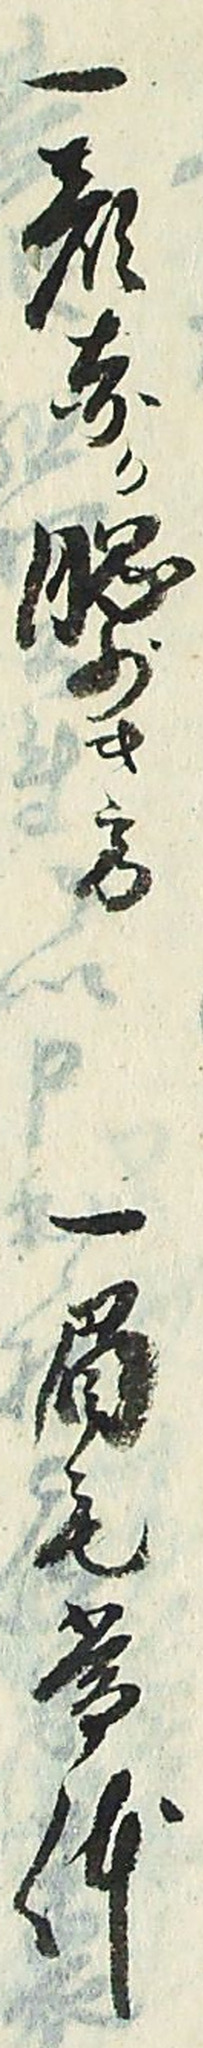一顔赤く腮少き方一眉毛常体
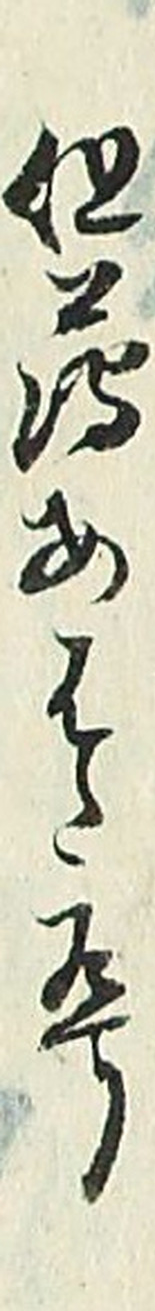但薄あはた有
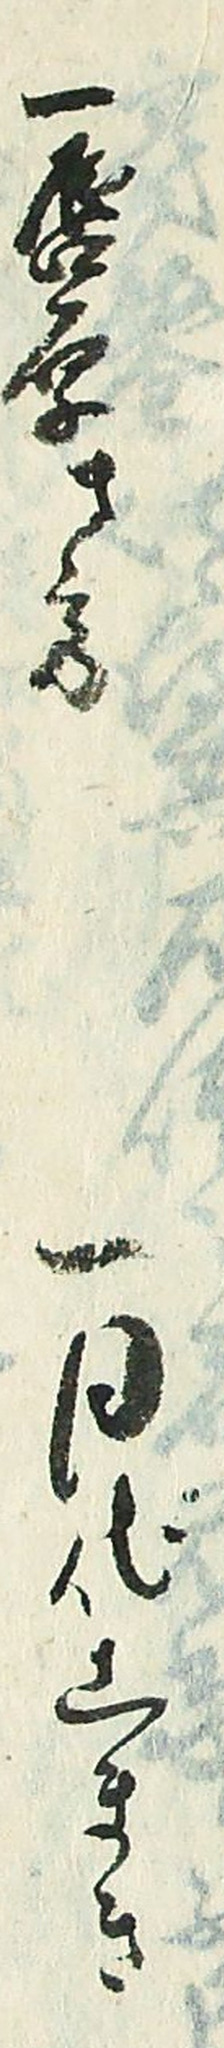一唇厚き方一月代こまき
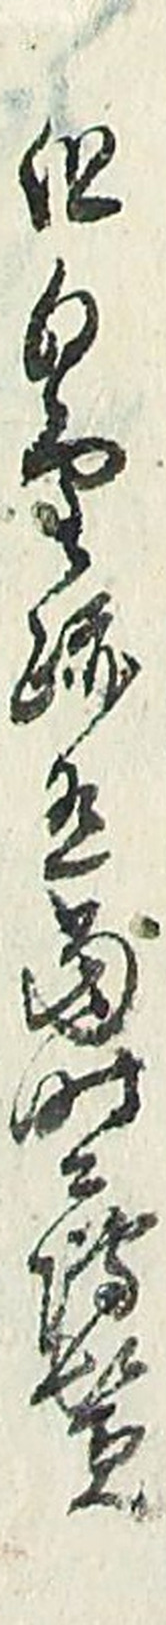但白雲跡有当時薄鬢

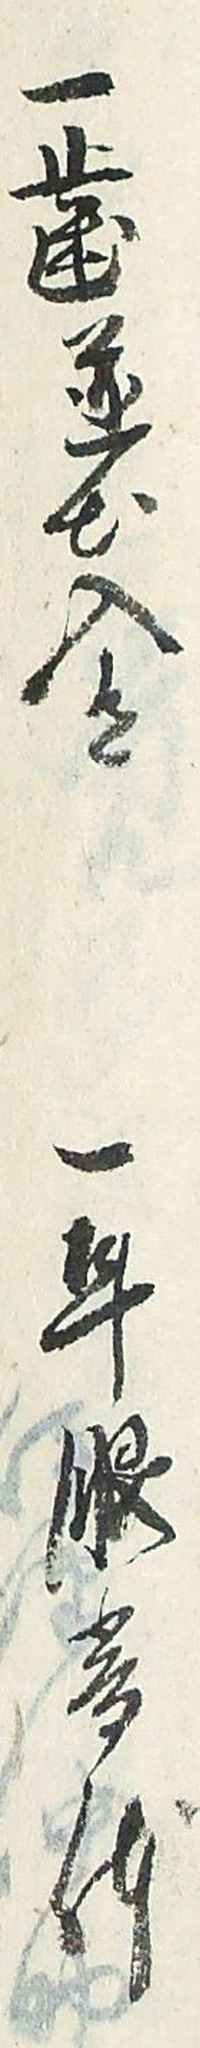一歯並出入有一耳眼常体
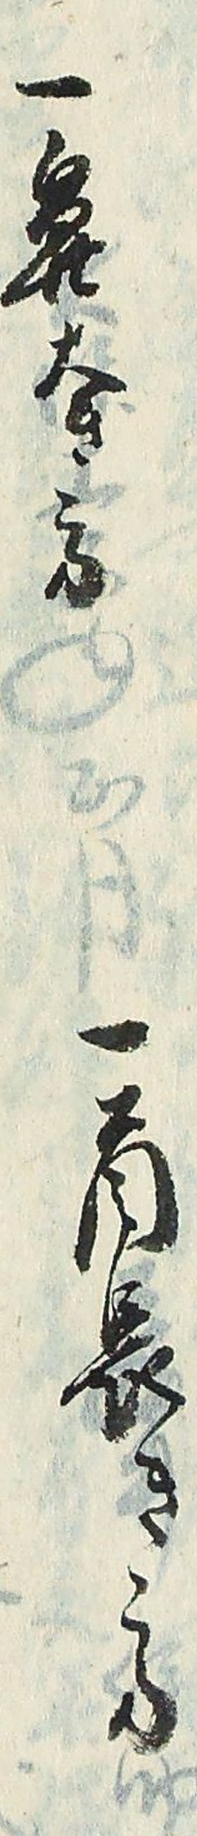一鼻大き方一眉長き方
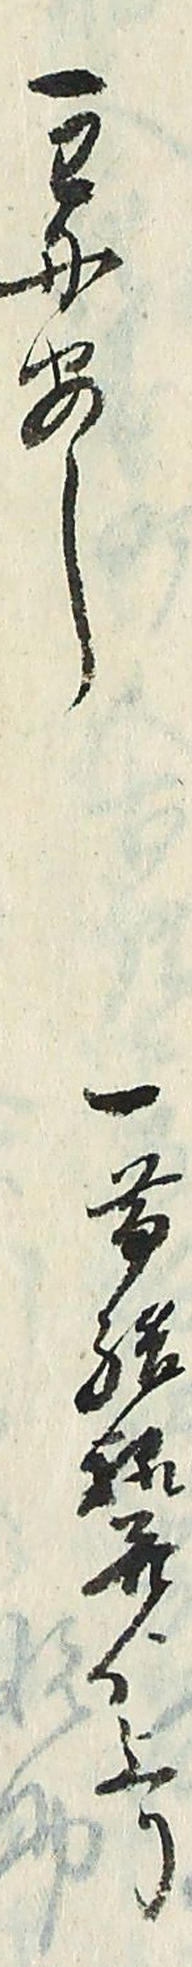一わにあし一帯結様幷ゟ上り
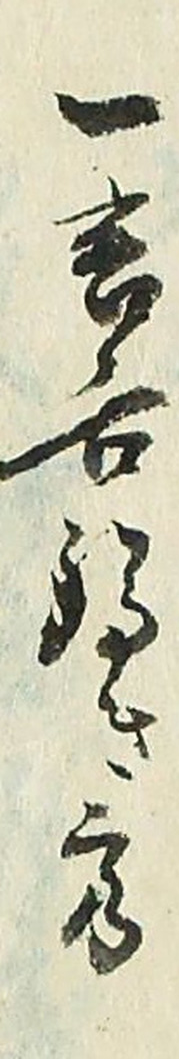一言舌弱き方
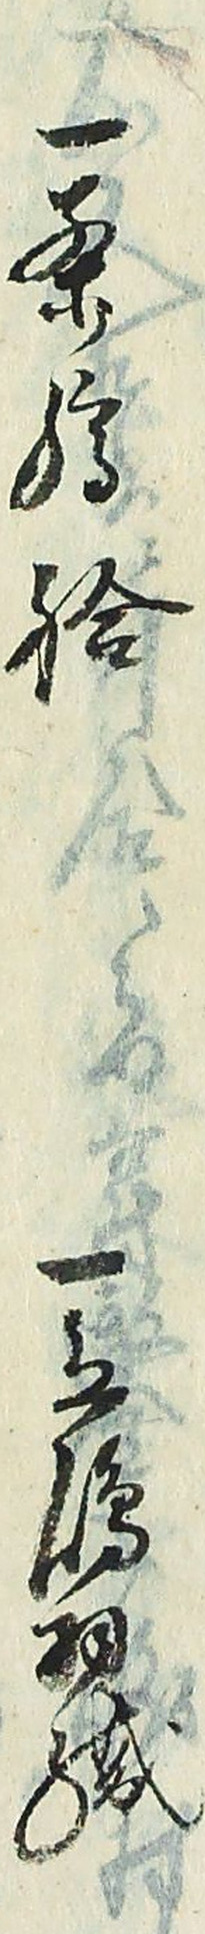一茶縞袷一立嶋羽織
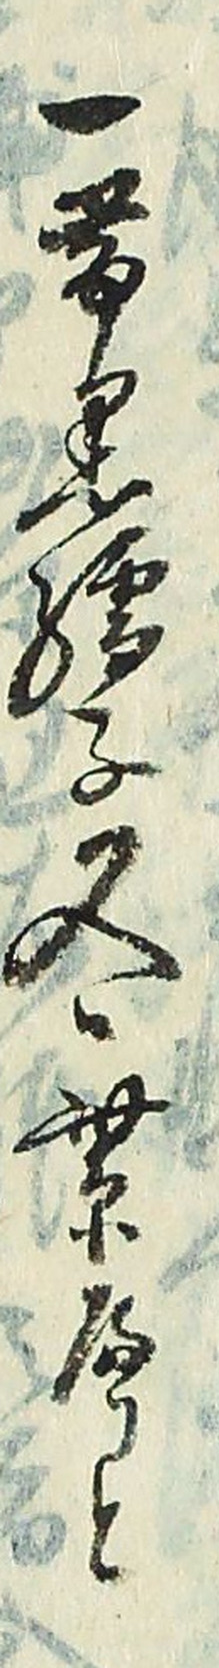一帯黒繻子又は紫へりと
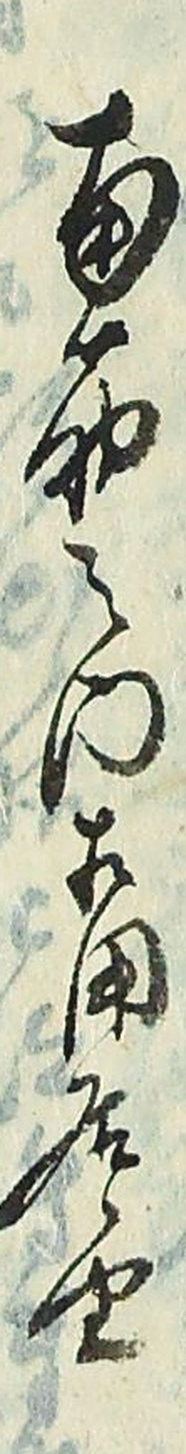両筋之内相用居候由
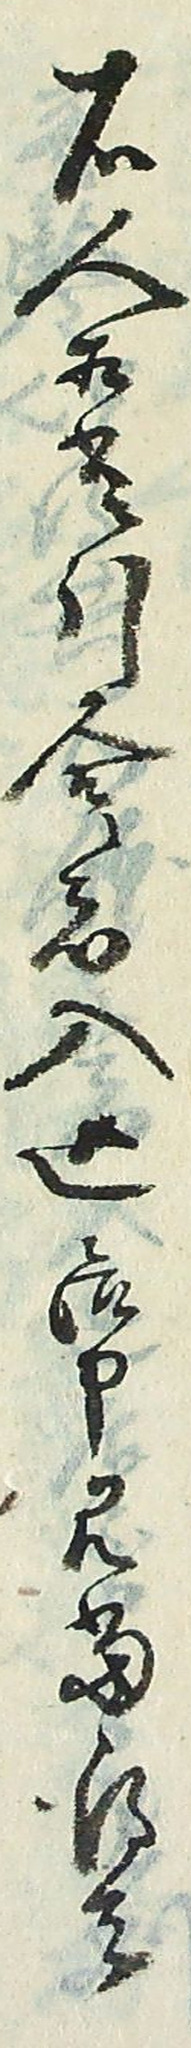右人相書に引合候者入込居見当候得は
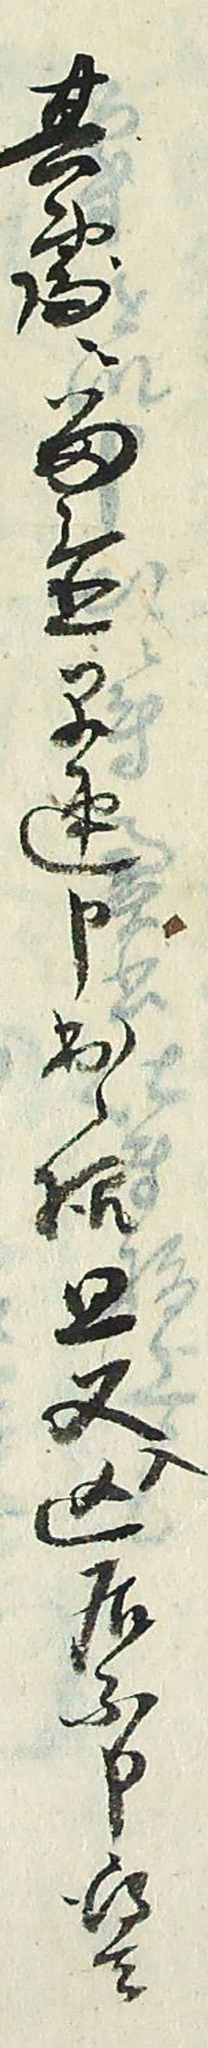其処に留置早速申出候様且又入込居不申候得は
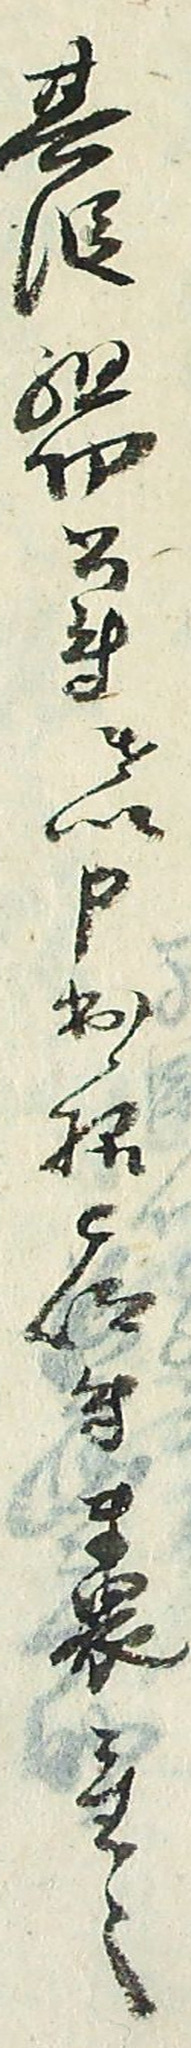其段組切書付を以申出候様被仰付奉畏重々
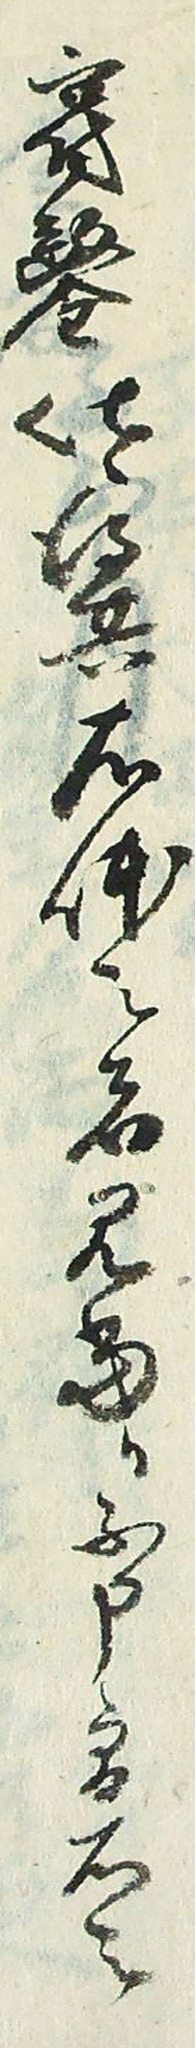穿鑿仕候得共右体之者見当り不申候間右之
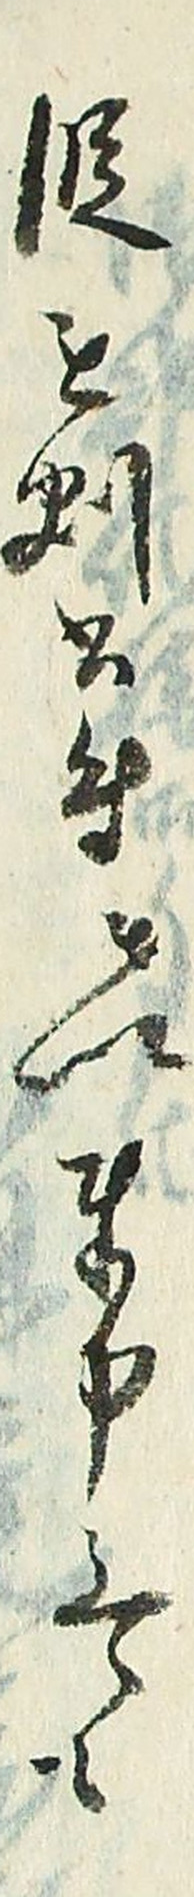段連判書付を以奉申上候以上
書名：諸御用御□受書控
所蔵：鳴門教育大学 Naruto University of Education
